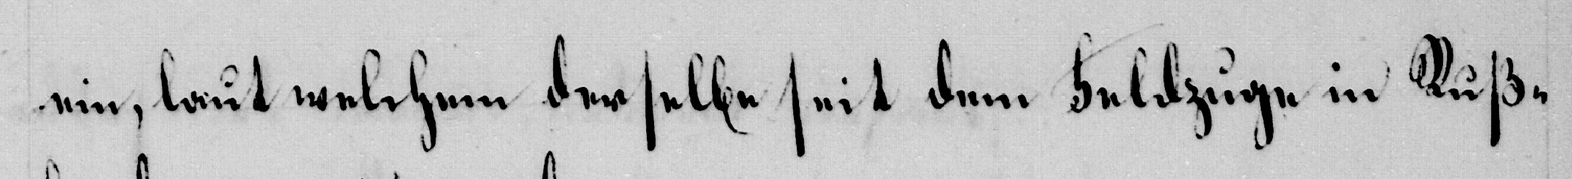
ein, laut welchem derselbe seit dem Feldzuge in Ruß¬
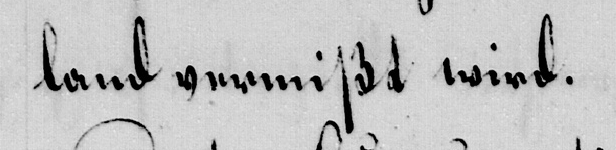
land vermißt wird.
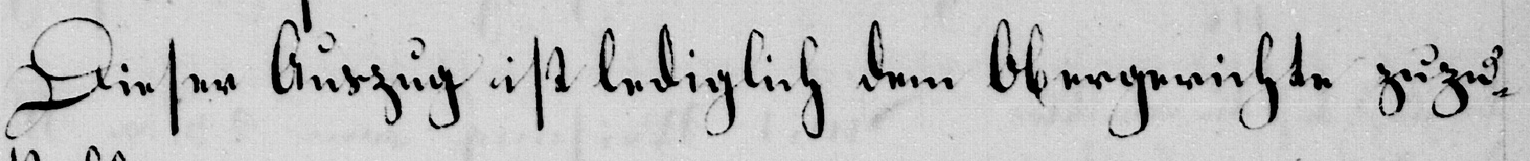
Dieser Auszug ist lediglich dem Obergerichte zuzu¬
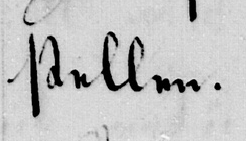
stellen.
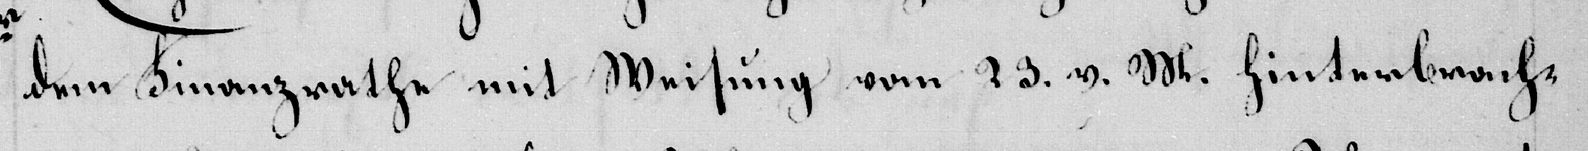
dem Finanzrathe mit Weisung vom 23. v. M. hinterbrach¬
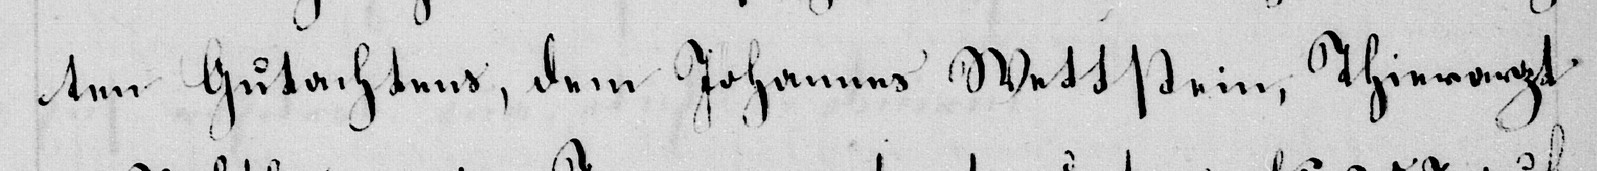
ten Gutachtens, dem Johannes Wettstein, Thierarzt
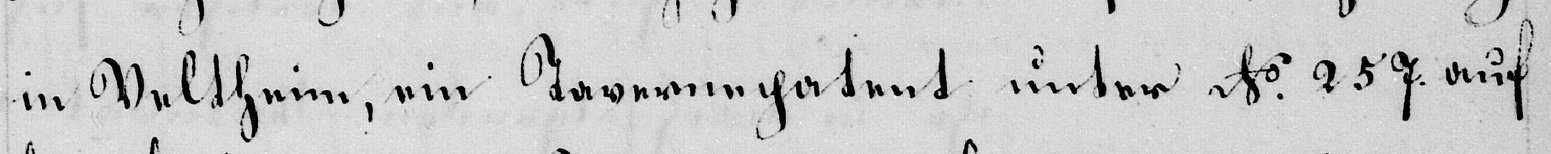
in Veltheim, ein Tavernepatent unter No. 257. auf
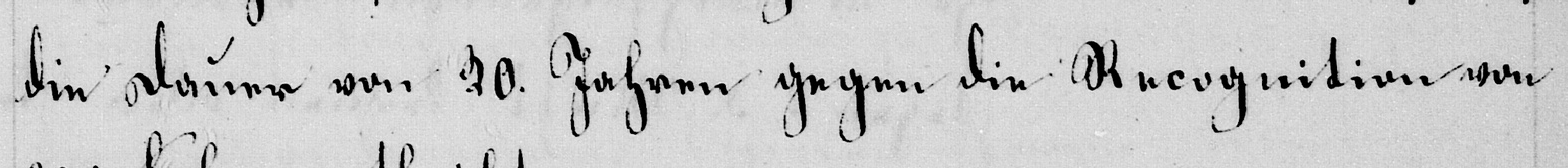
die Dauer von 20. Jahren gegen die Recognition von
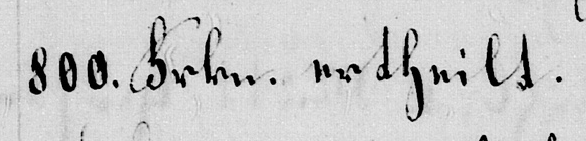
800 Frkn. ertheilt.
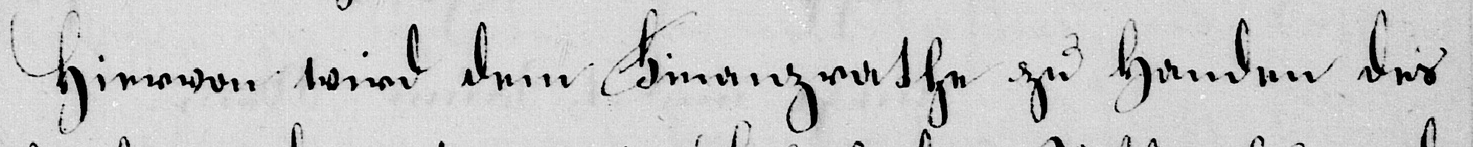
Hiervon wird dem Finanzrathe zu Handen des
